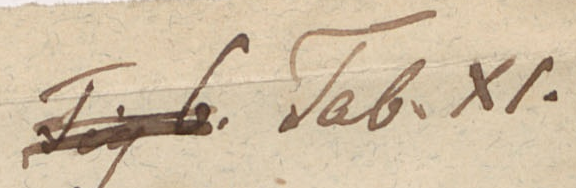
Fig 6. Tab. XI.
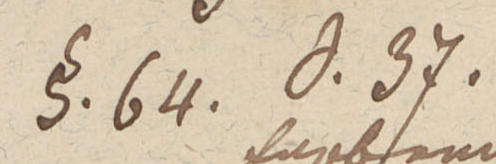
§. 64. S. 37.
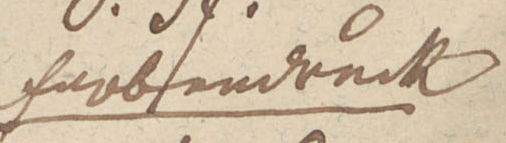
Farbendruck
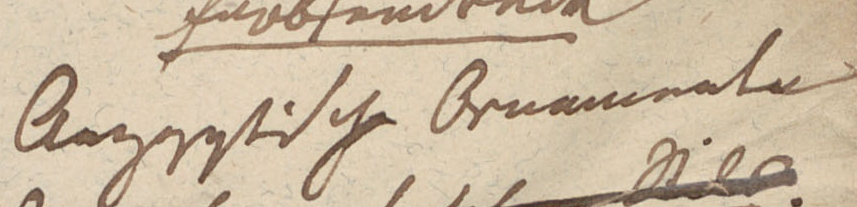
Aegyptische Ornamente
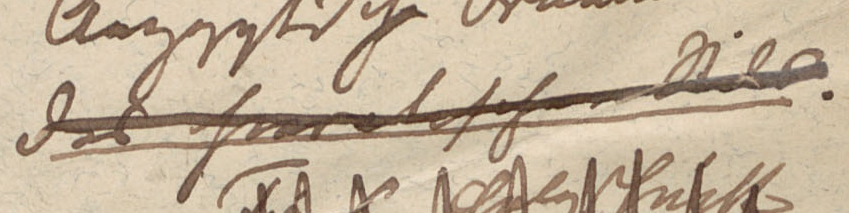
des hieratischen Stils.
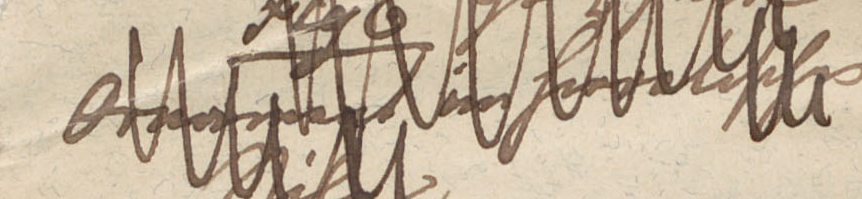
Ornament im hieratischen
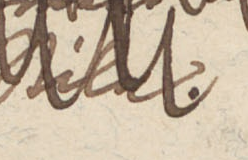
Stile.
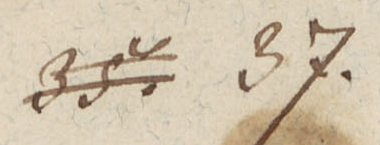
35. 37.
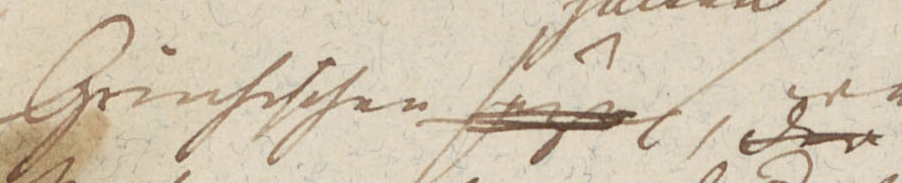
Griechischen seyn halten, wären
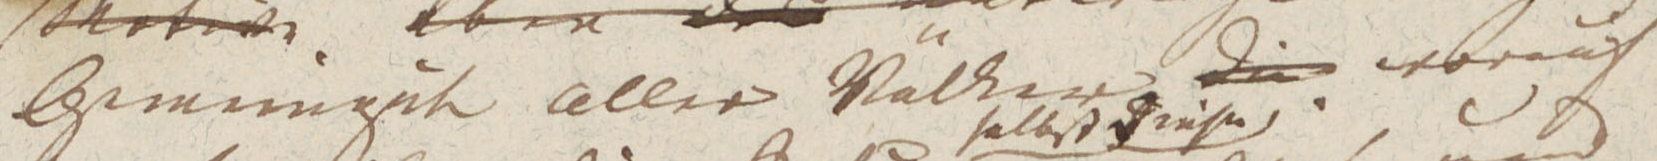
Gemeingut aller Völker die worauf
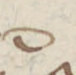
diese
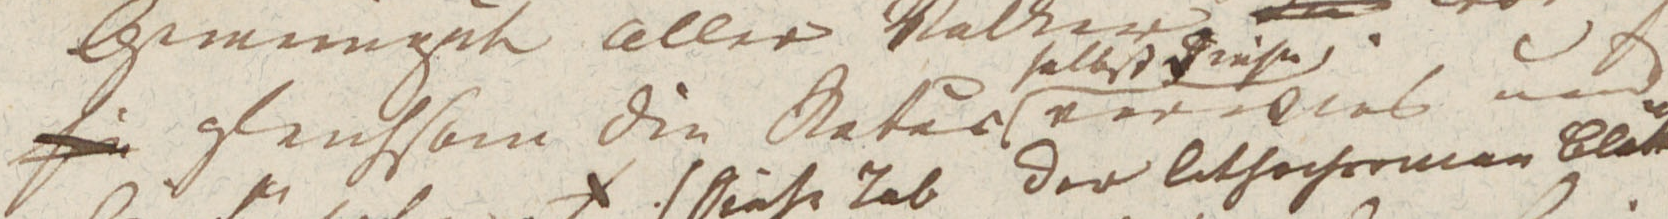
sie gleichsam die Natur selbst diese
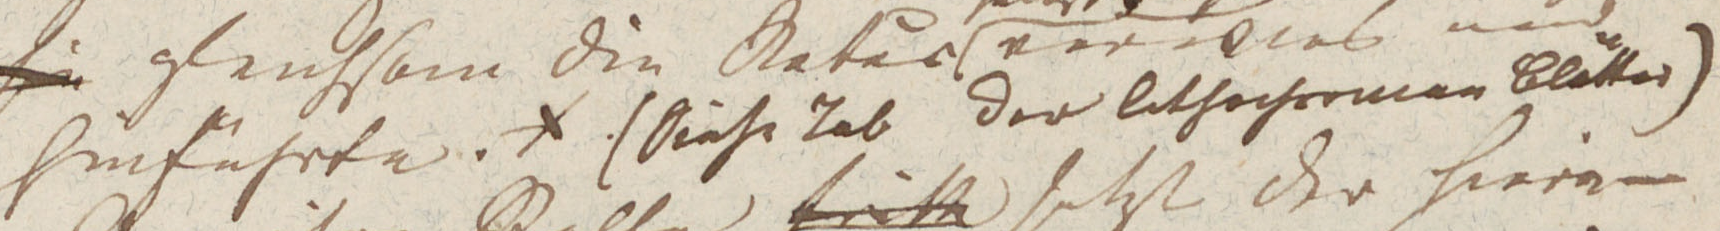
hinführte. % (Siehe Tab der lithochromen Blätter)
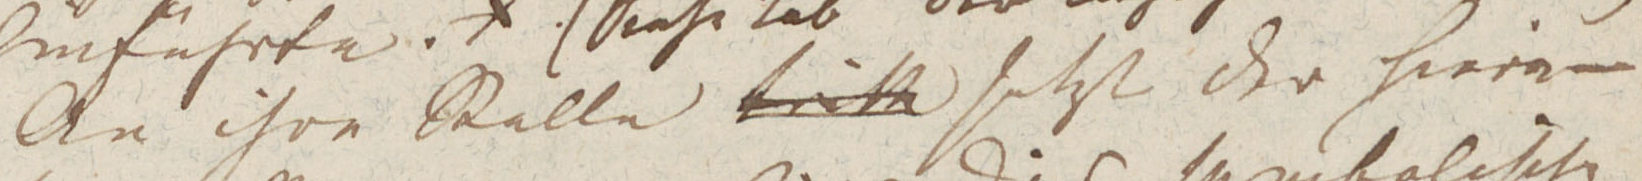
An ihre Stelle tritt setzt der hiera-
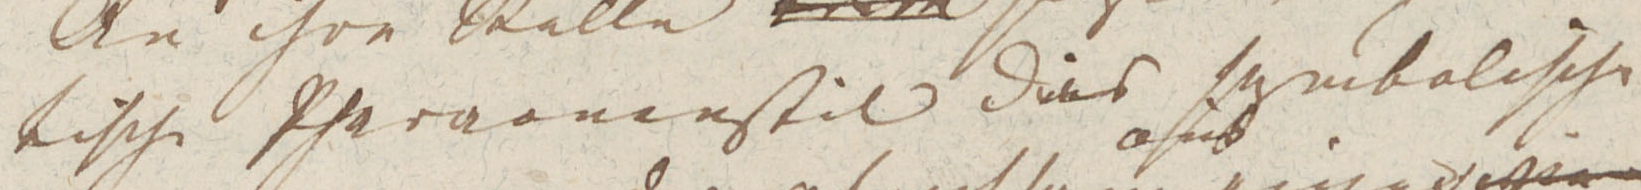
tische Pharaonenstil dieas symbolische
